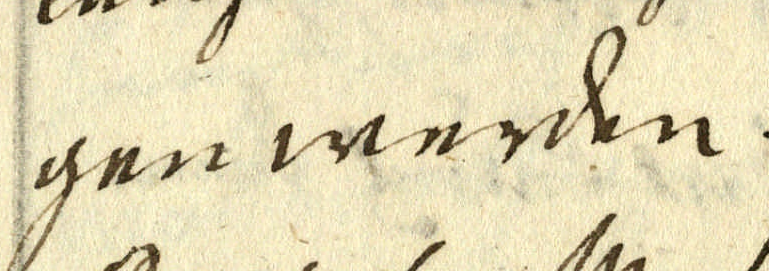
gen werden.
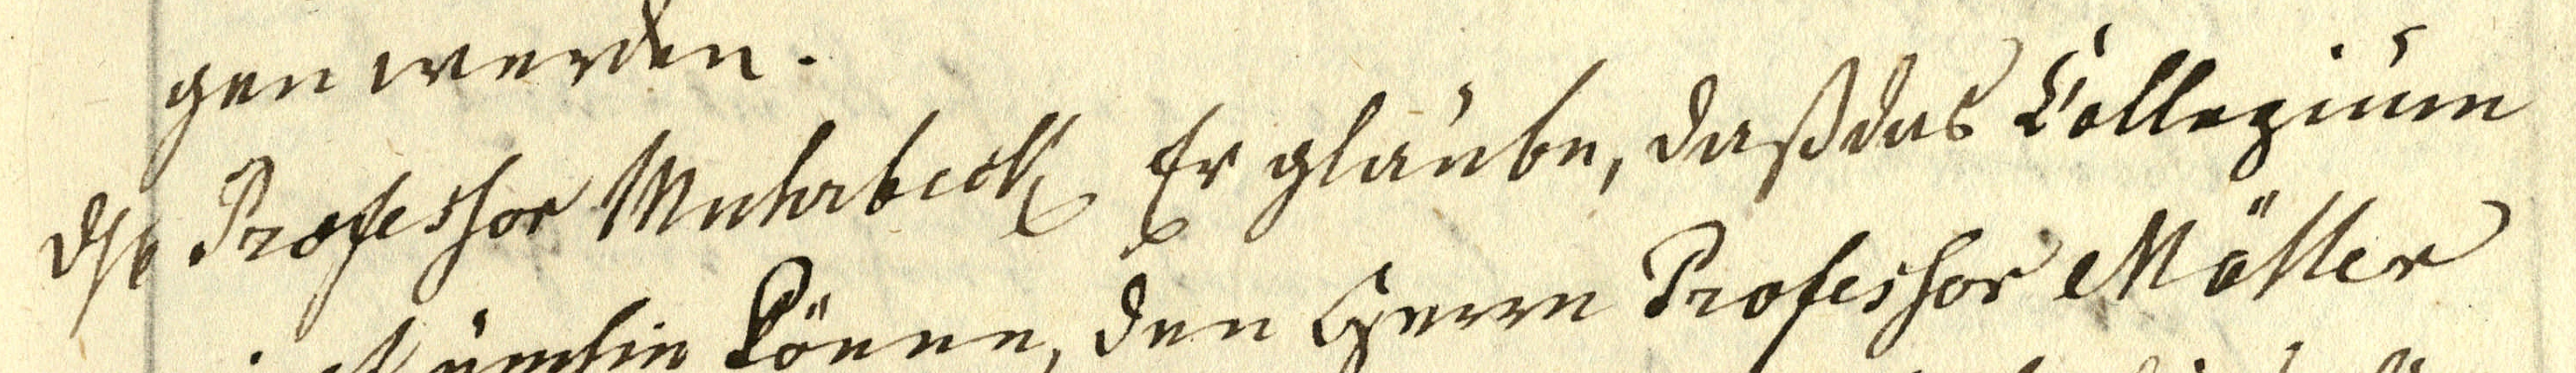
dh Professor Muhrbeck. Er glaube, daß das Collegium
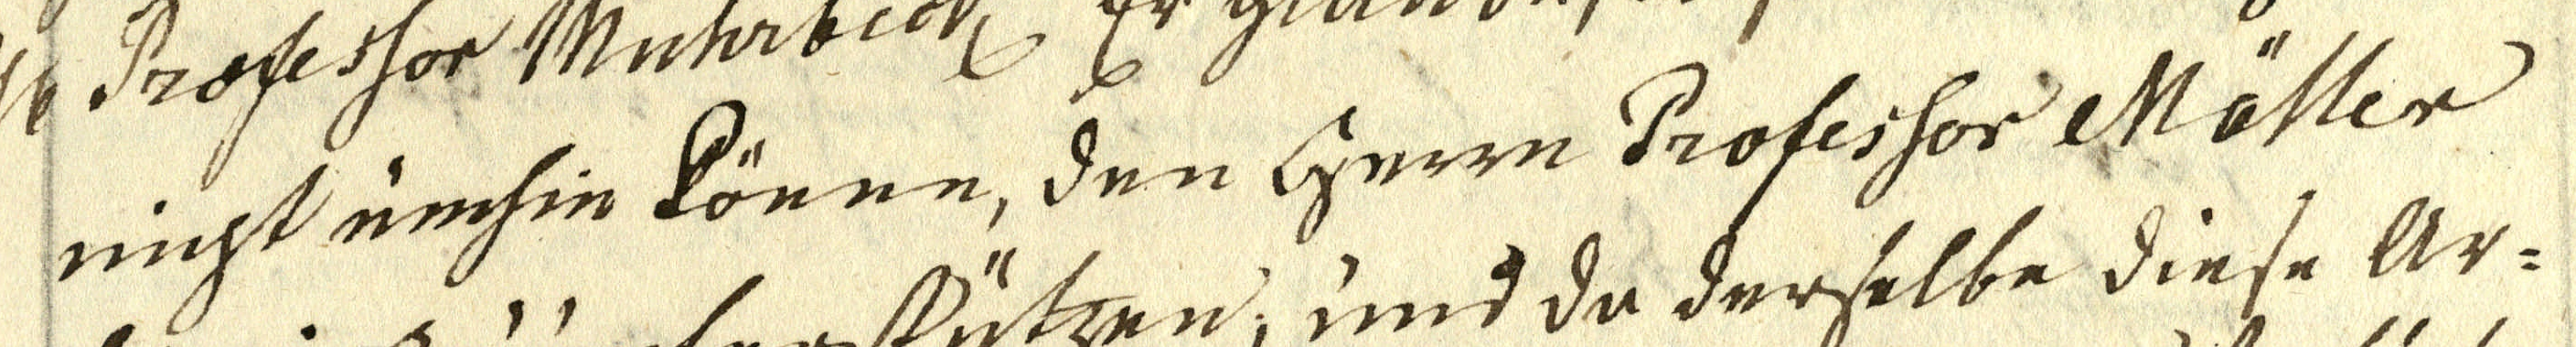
nicht umhin könne, den Herrn Professor Möller
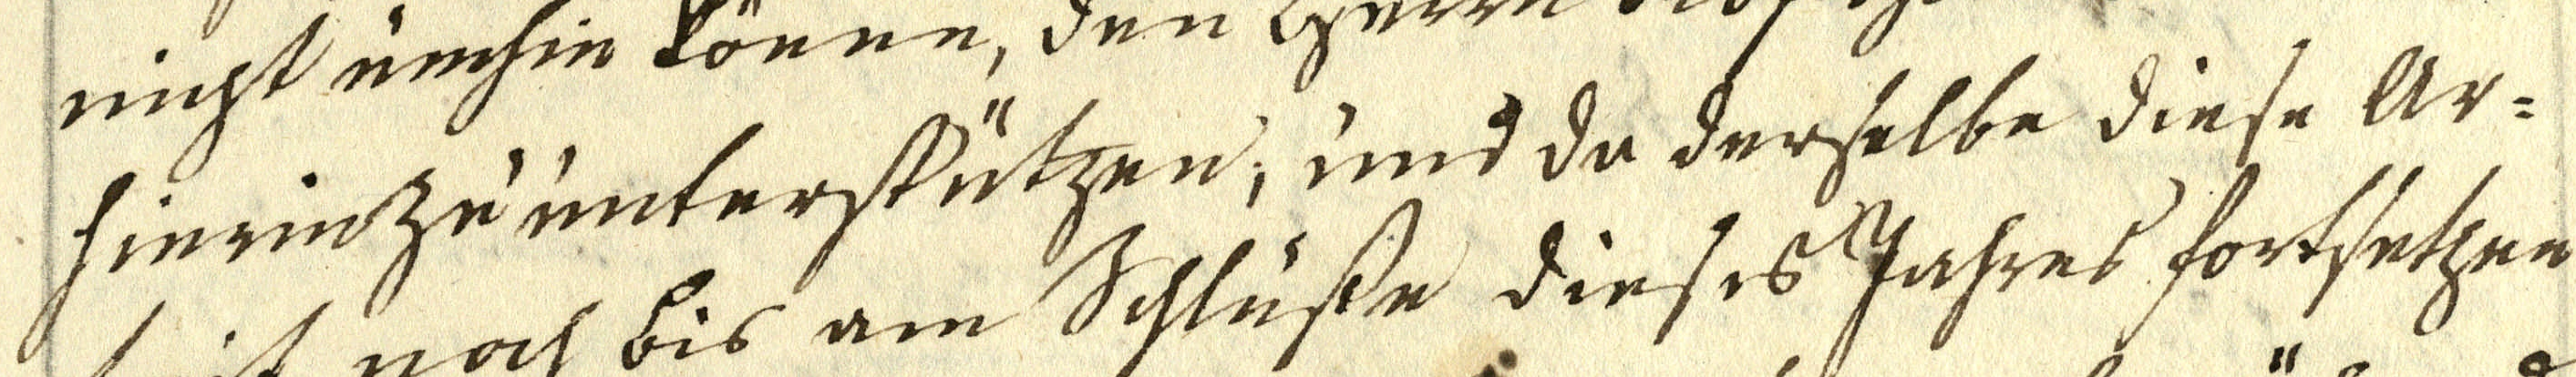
hierin zu unterstützen, und da derselbe diese Ar¬
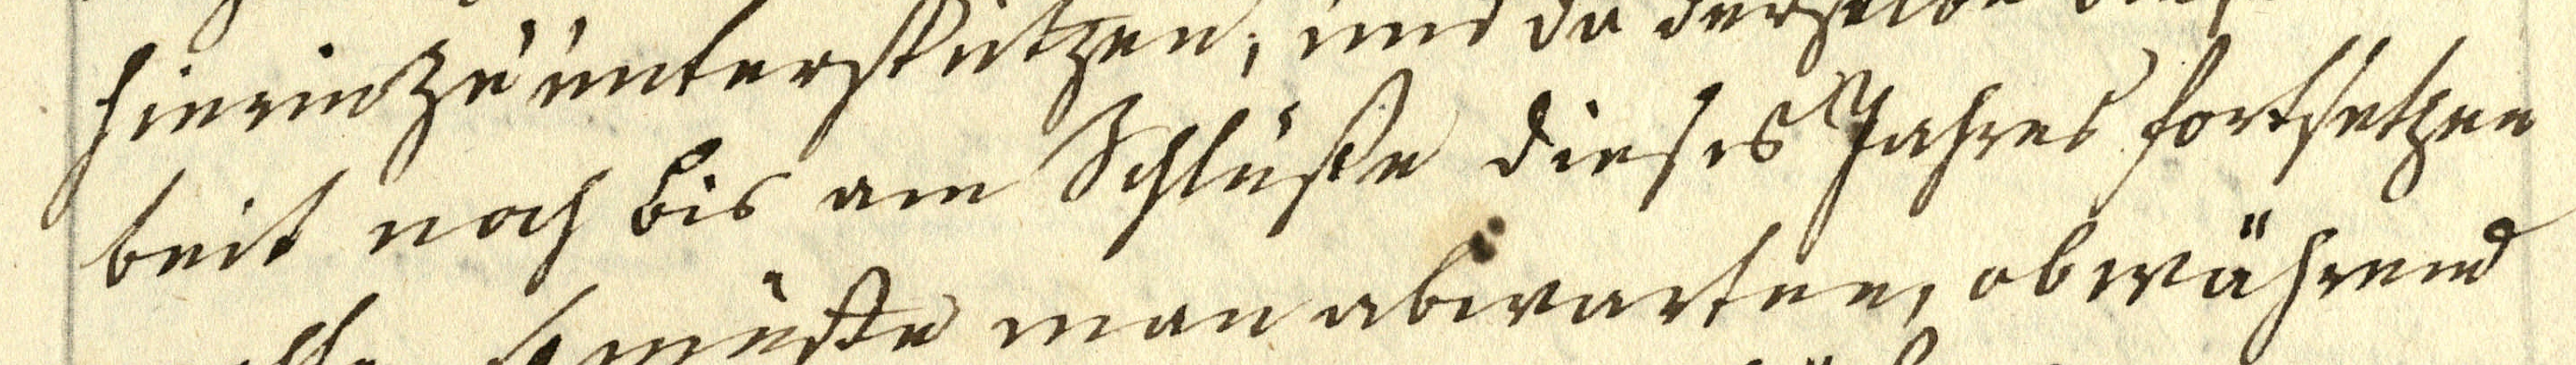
beit noch bis am Schluße dieses Jahres fortsetzen
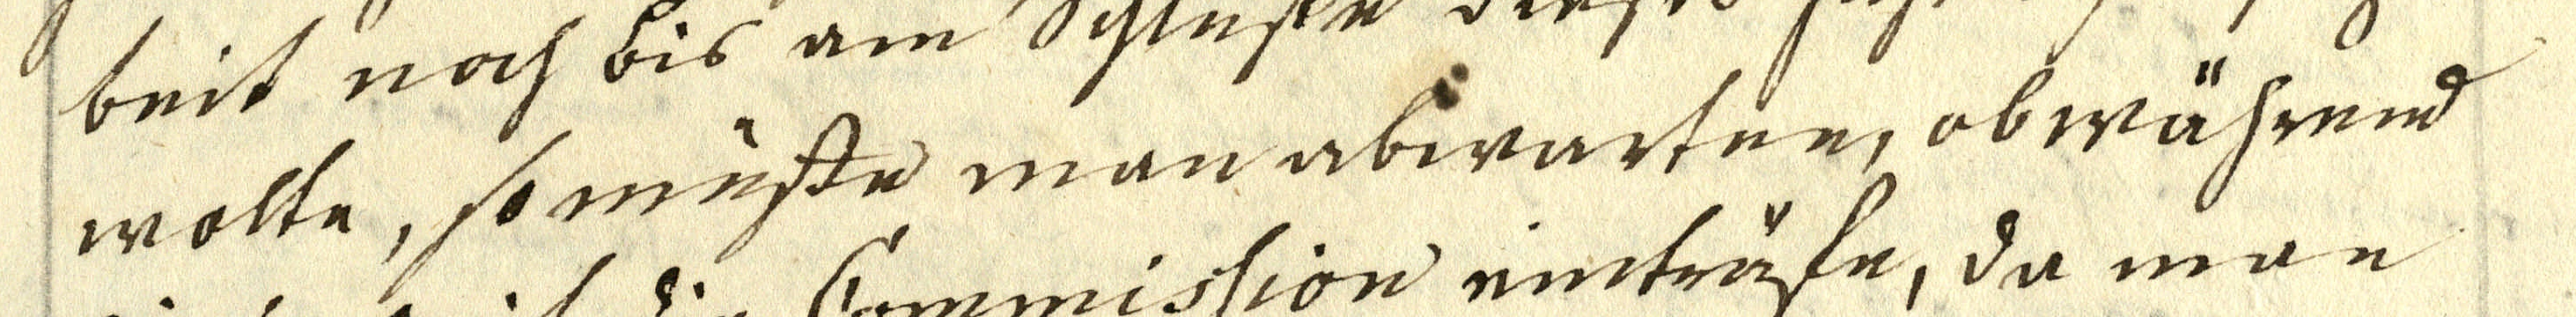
wolte, so müste man abwarten, ob während
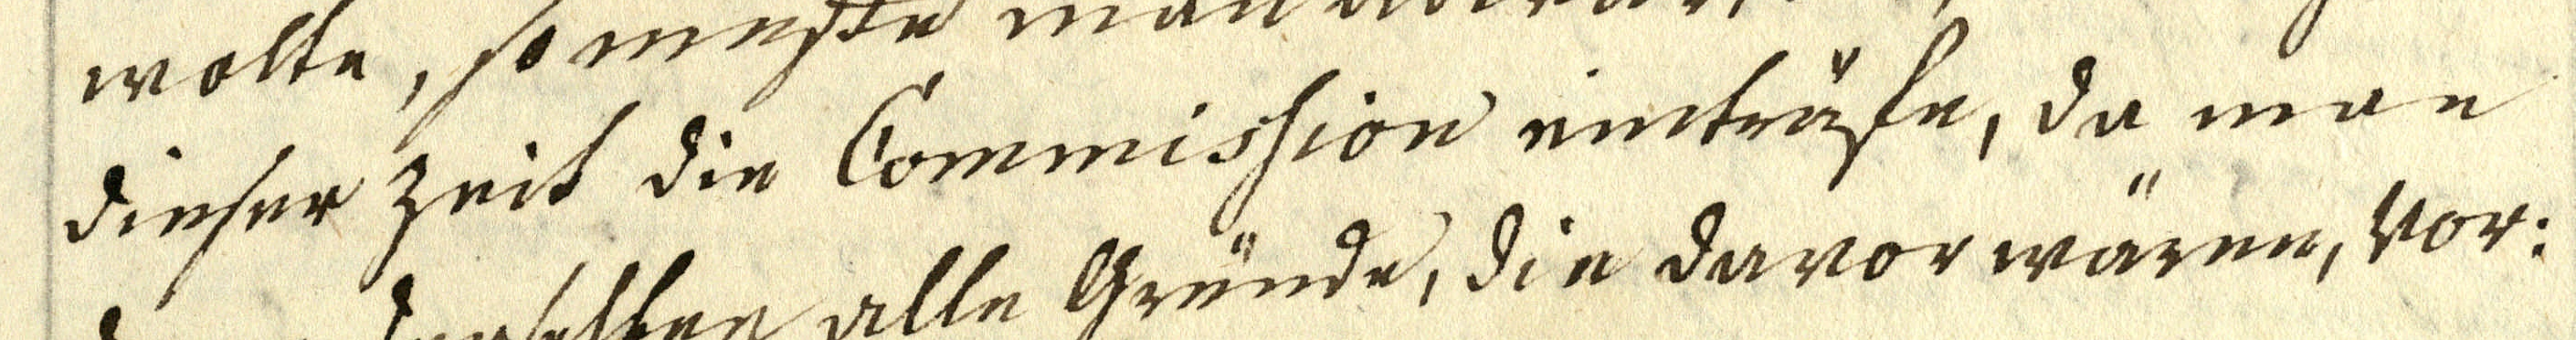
dieser Zeit die Commission einträfe, da man
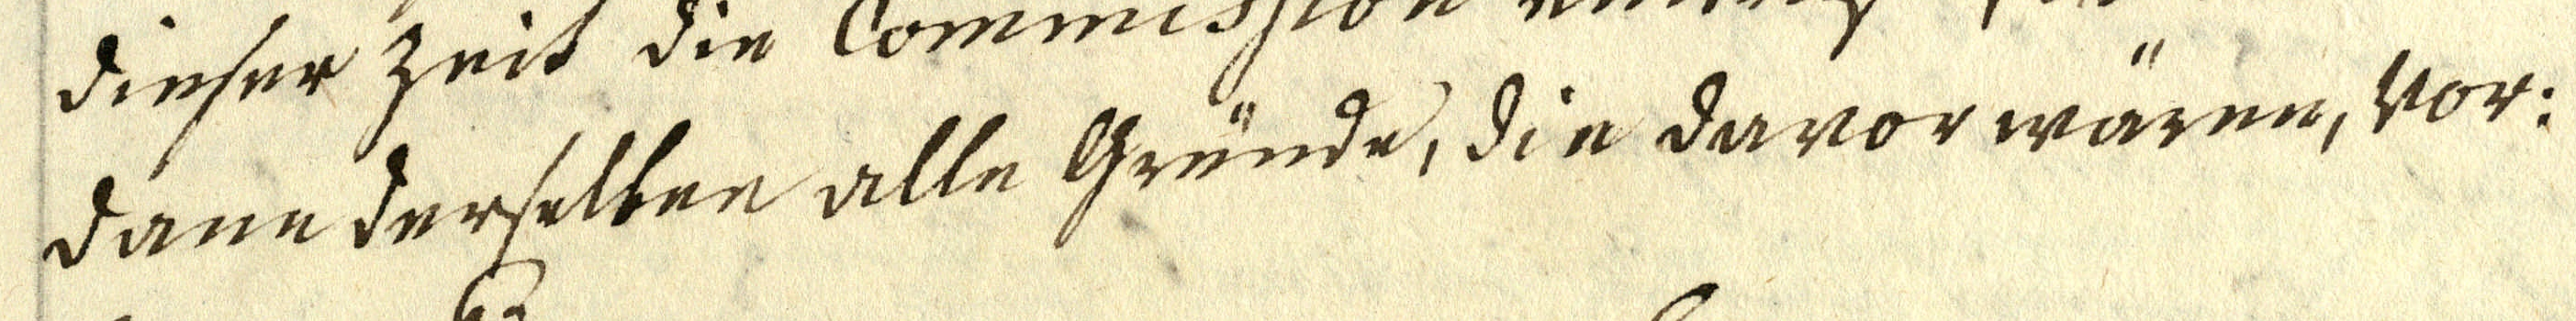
dann derselben alle Gründe, die davor wären, vor¬
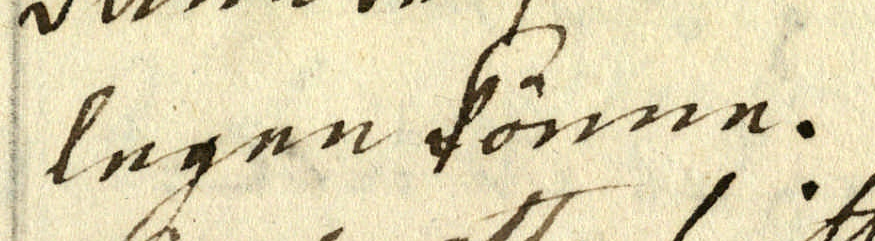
legen könne.
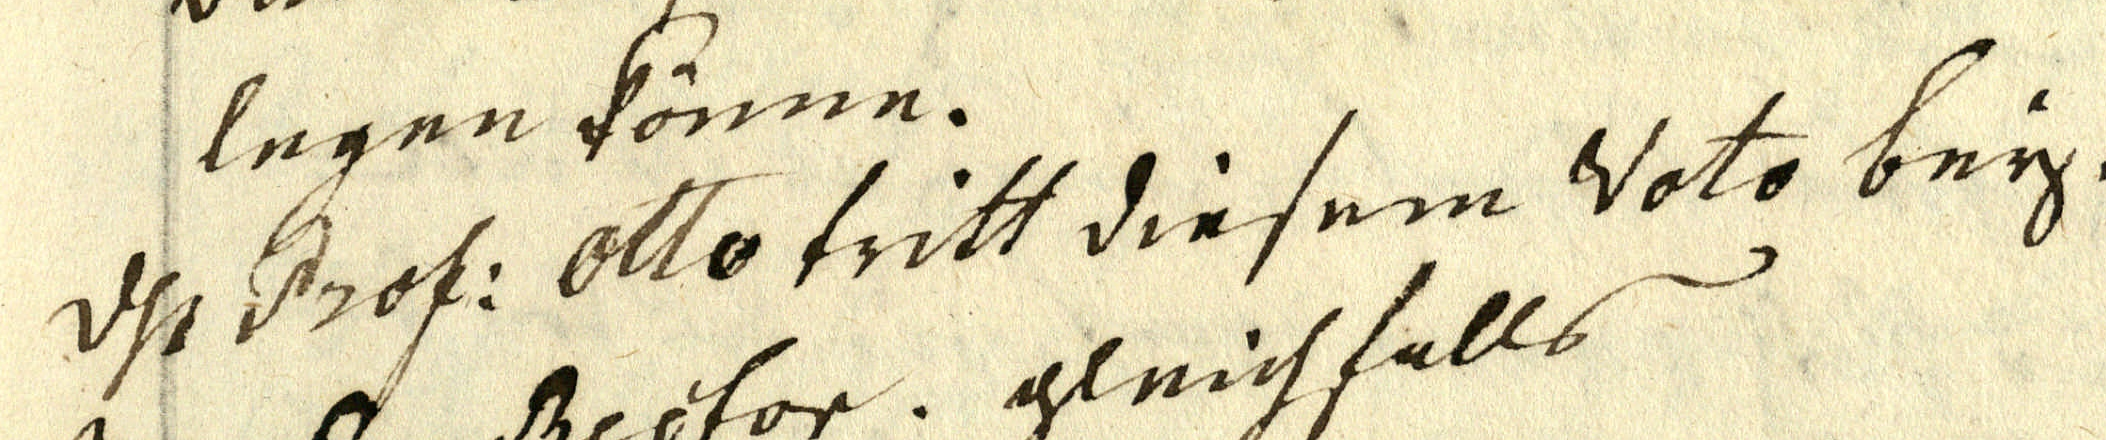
dh. Prof. Otto tritt diesem Voto beÿ.
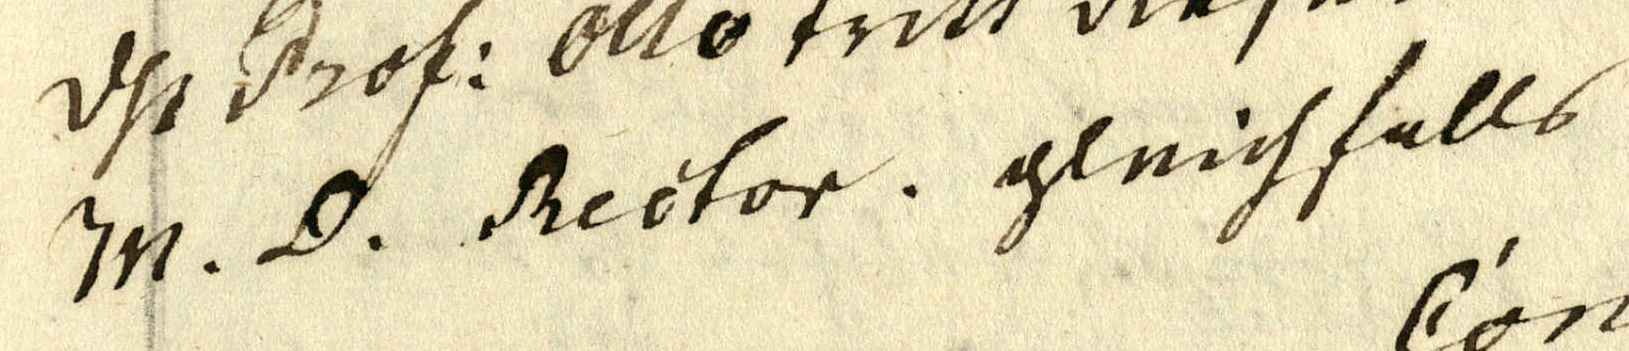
M. D. Rector gleichfalls
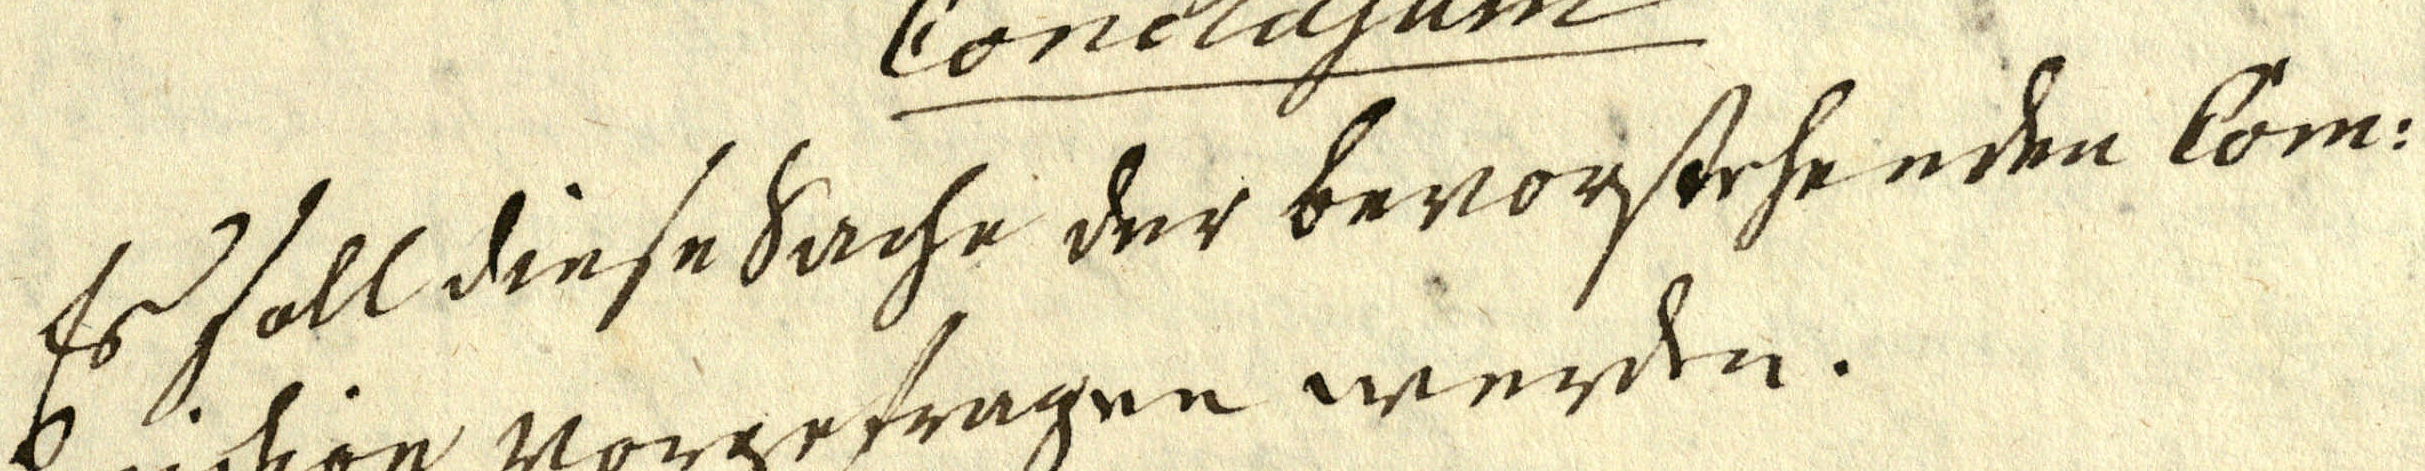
Er soll diese Sache der bevorstehenden Com¬
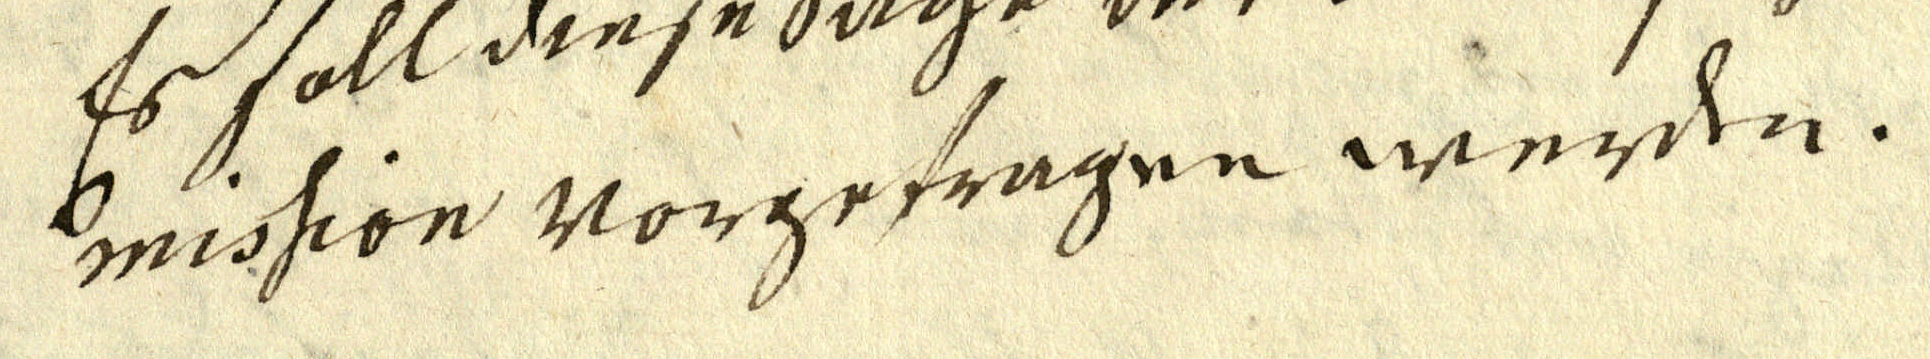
mission vorgetragen werden.
